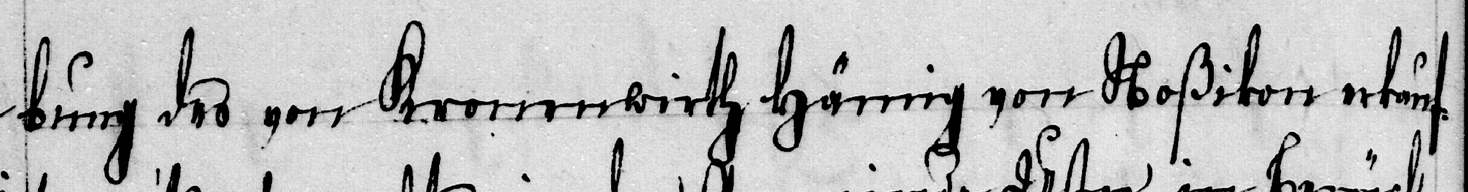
bung des von Kronenwirth Hämig von Noßikon erkauf¬
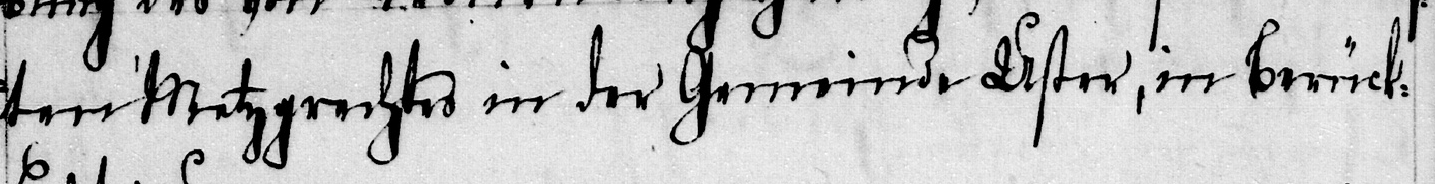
ten Metzgrechtes in der Gemeinde Uster, in Berück¬
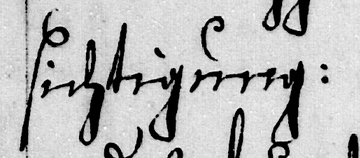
sichtigung:
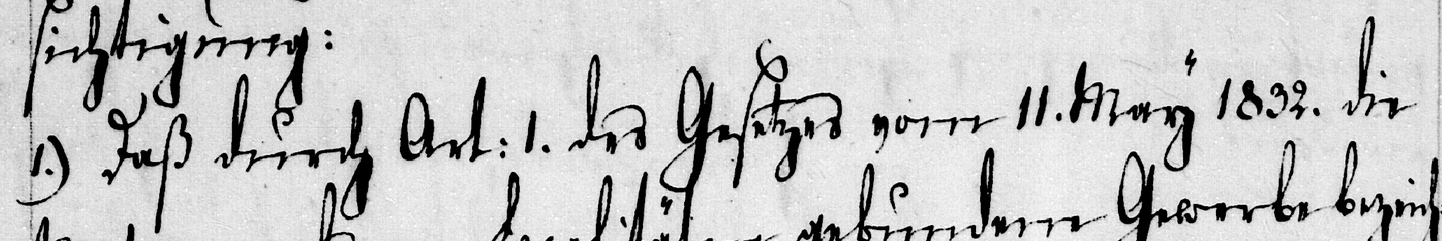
1.) Daß durch Art: 1. des Gesetzes vom 11. May 1832. die
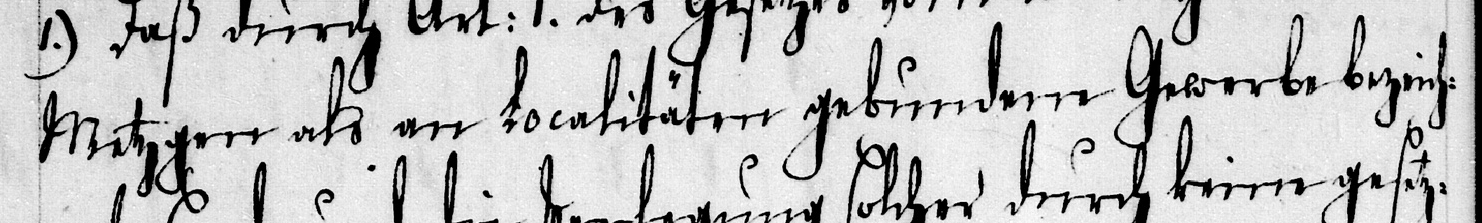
Metzgen als an Localitäten gebundene Gewerbe bezeic¬
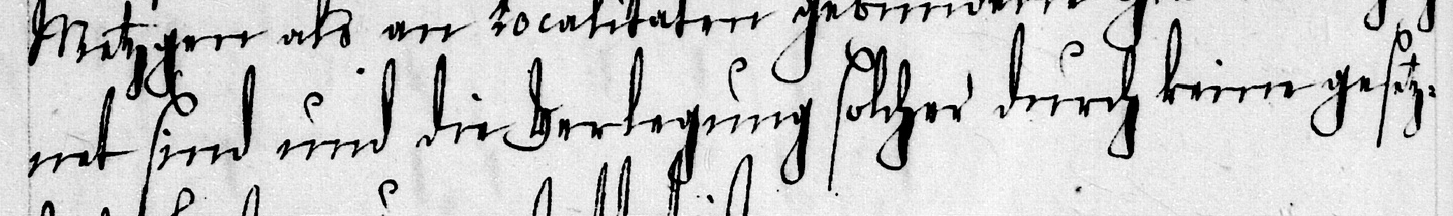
hnet sind und die Verlegung solcher durch keine geset¬
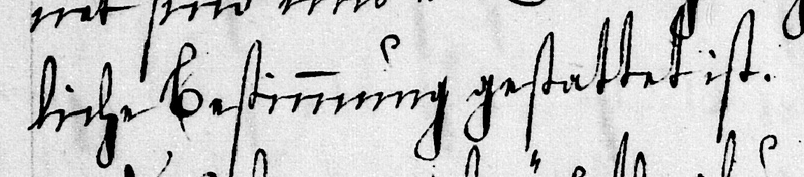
zliche Bestimmung gestattet ist.
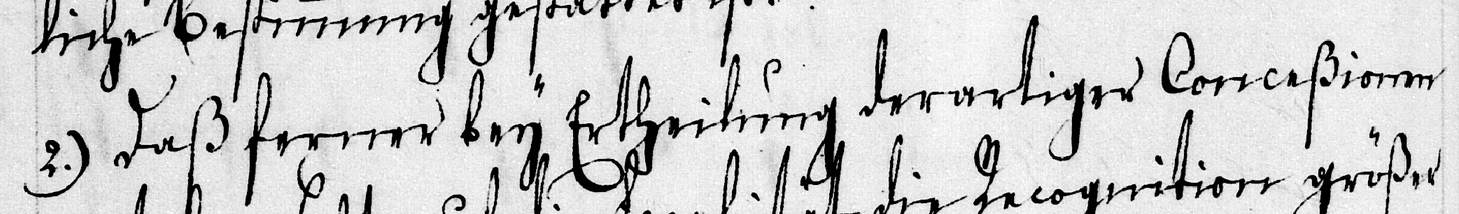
2.) Daß ferner bey Ertheilung derartiger Conceßionen
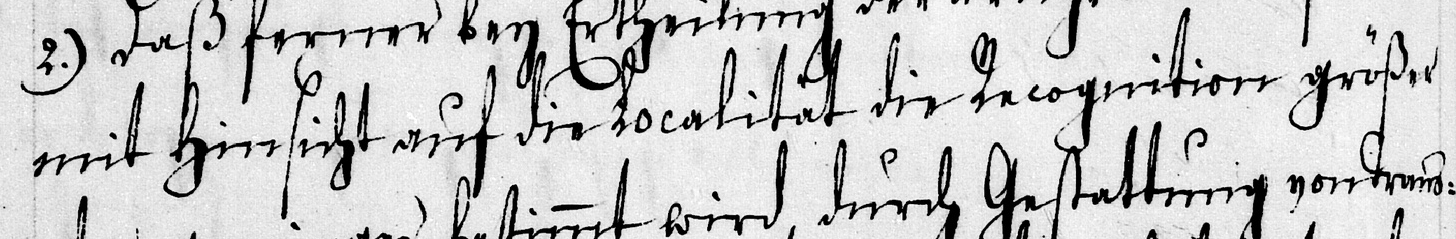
mit Hinsicht auf die Localität die Recognition größer
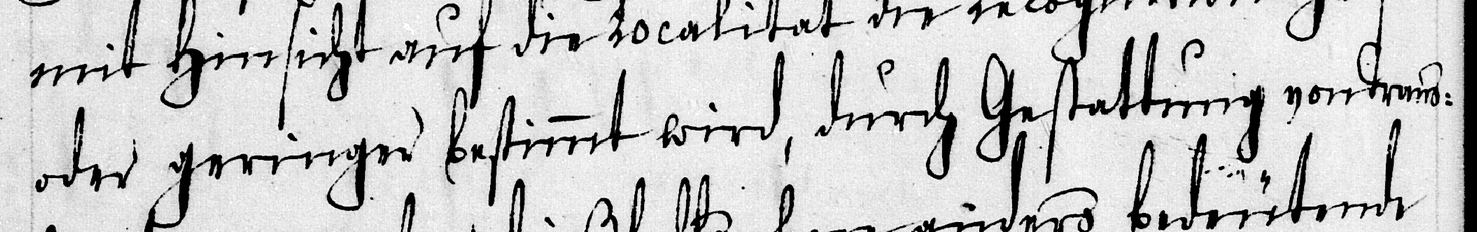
oder geringer bestimmt wird, durch Gestattung von Trans¬
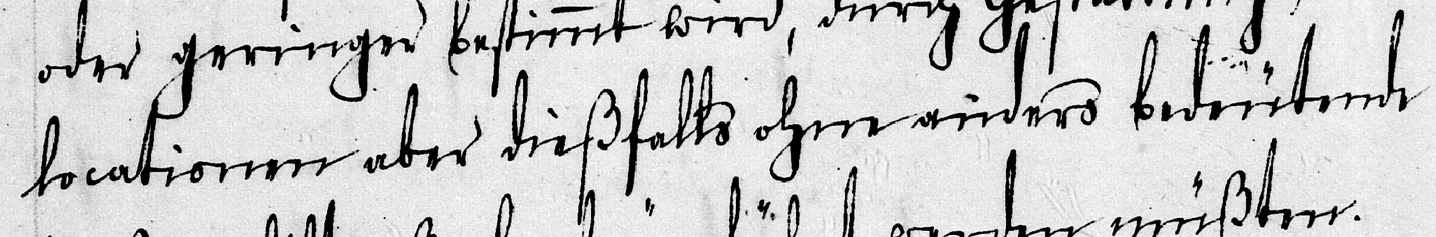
locationen aber dießfalls ohne anders bedeutende
